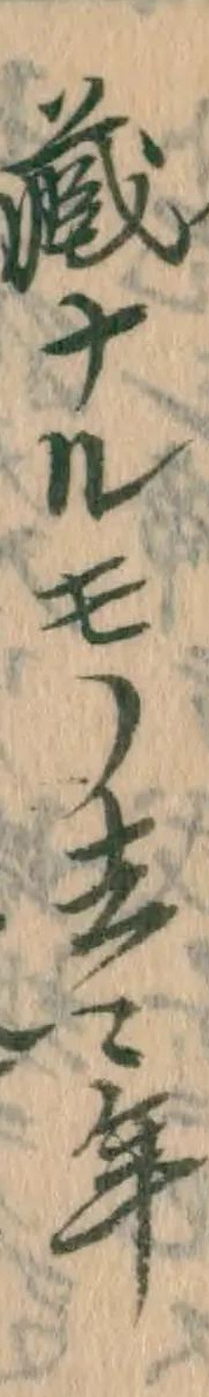藏ナルモノ去々年
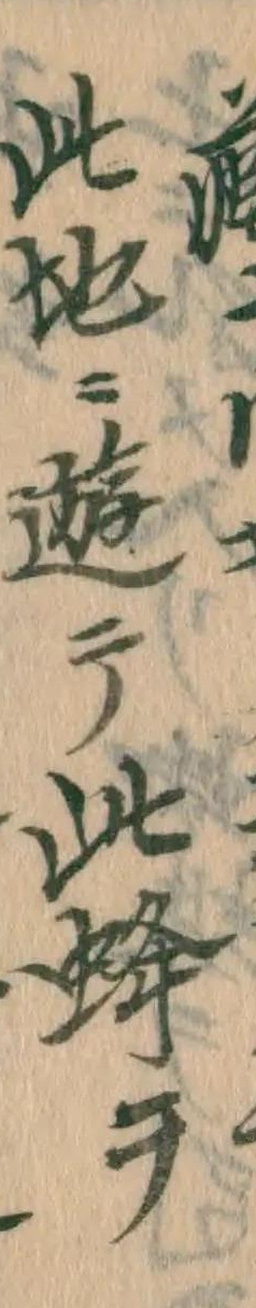此地ニ遊テ此蜂ヲ
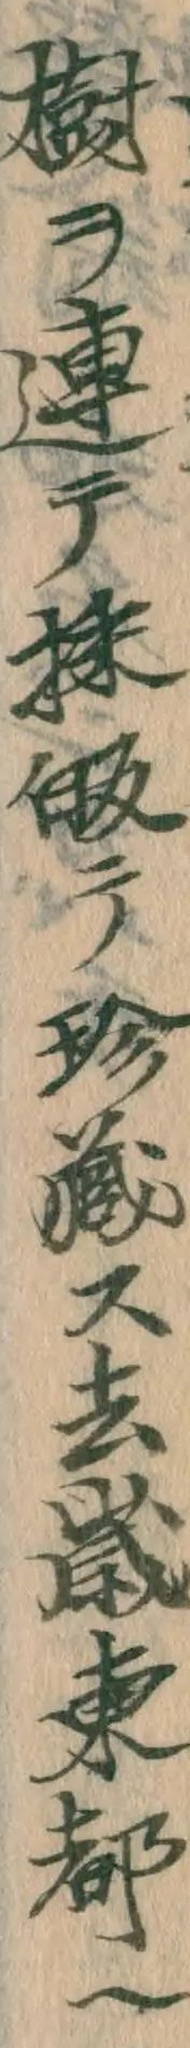樹ヲ連テ採皈テ珍藏ス去歳東都ヘ
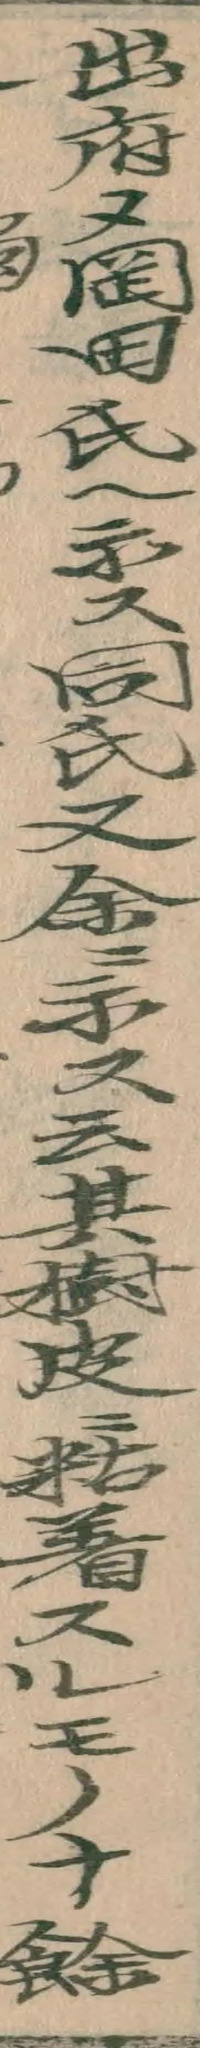出府シテ岡田氏ヘ示ス同氏又余ニ示ス云其樹皮ニ粘着スルモノ十餘
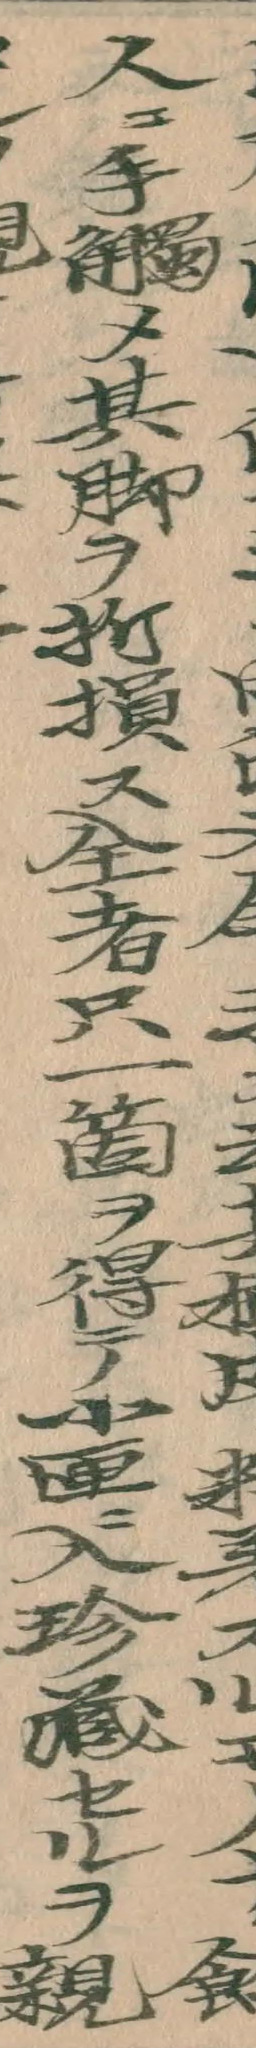人ニ手觸シテ其脚ヲ折損ス全者只一箇ヲ得テ小匣ニ入珍藏セルヲ親
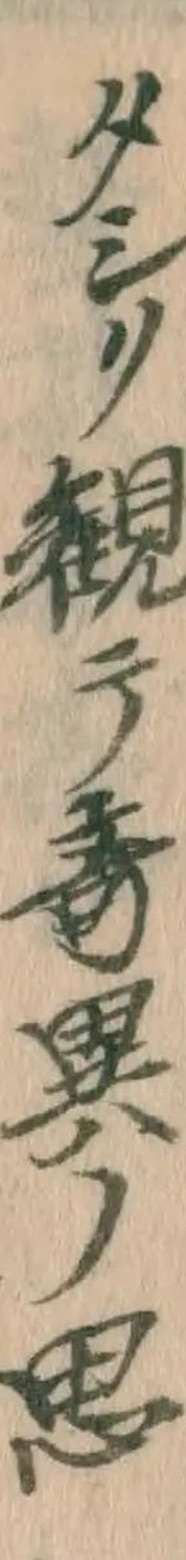タシク観テ奇異ノ思
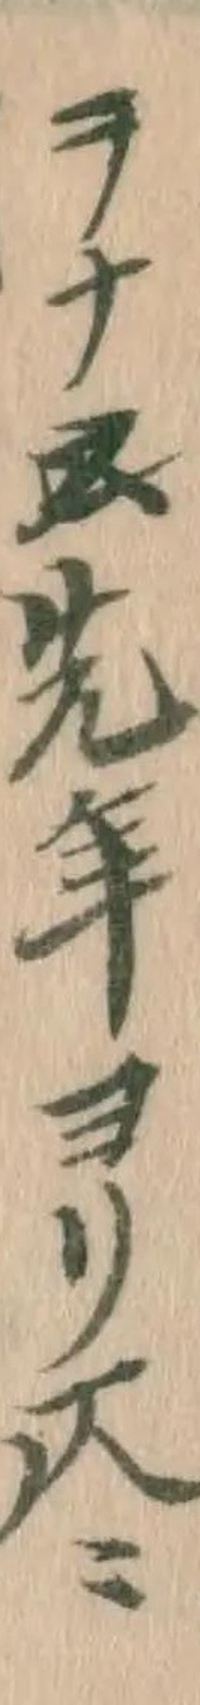ヲナス先年ヨリ仄ニ
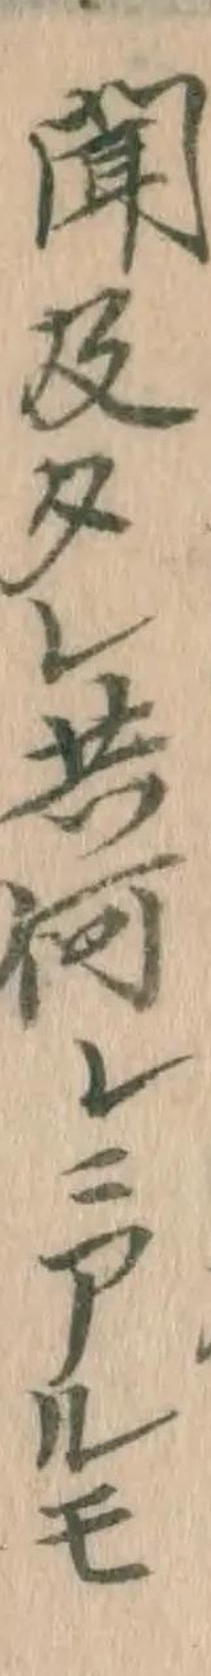聞及タレ共何レニアルモ
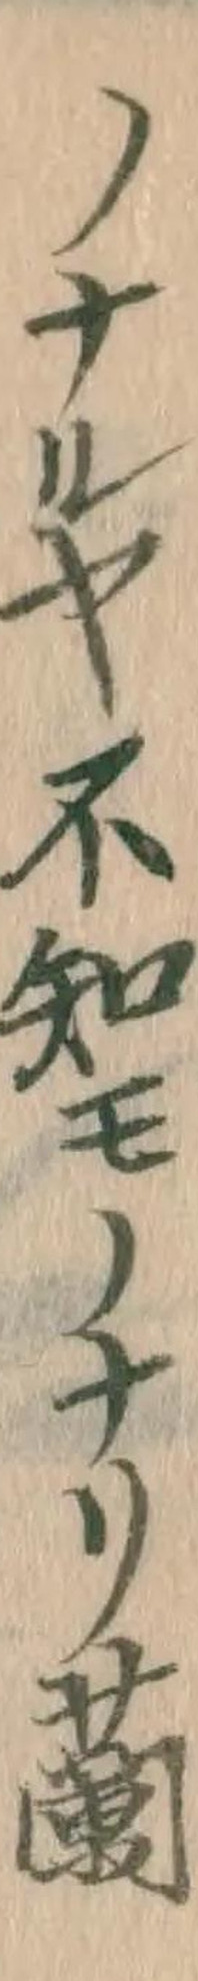ノナルヤ不知モノナリ蘭
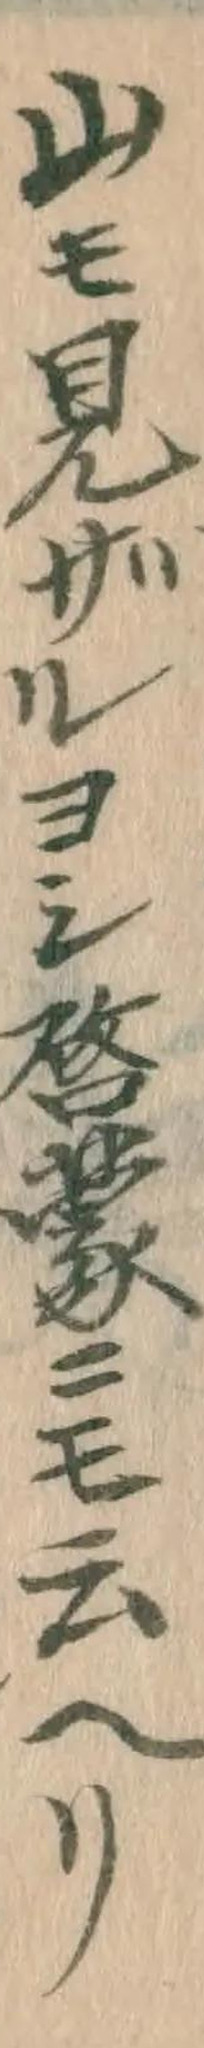山モ見ザルヨシ啓蒙ニモ云ヘリ
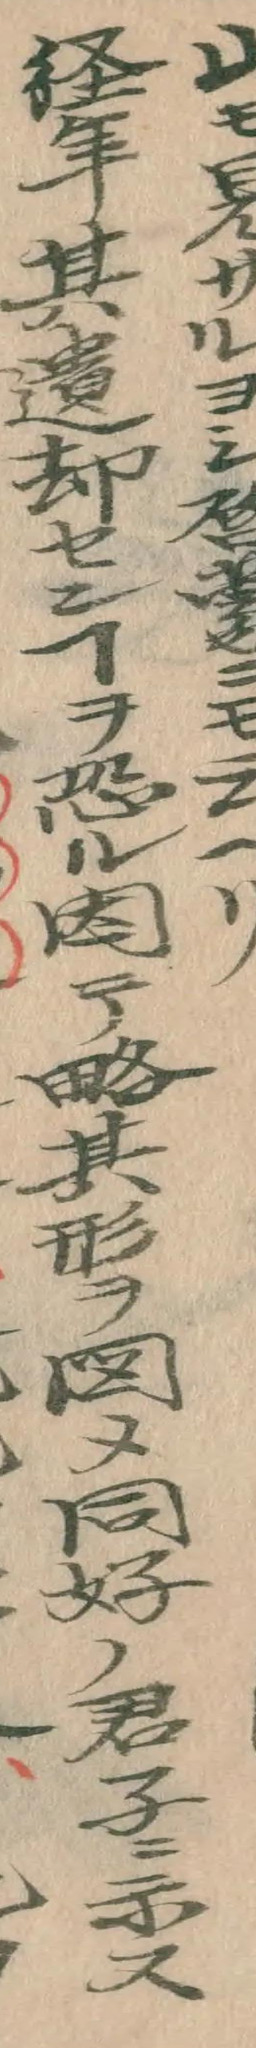経年其遺却センコトヲ恐ル因テ略其形ヲ図シテ同好ノ君子ニ示ス
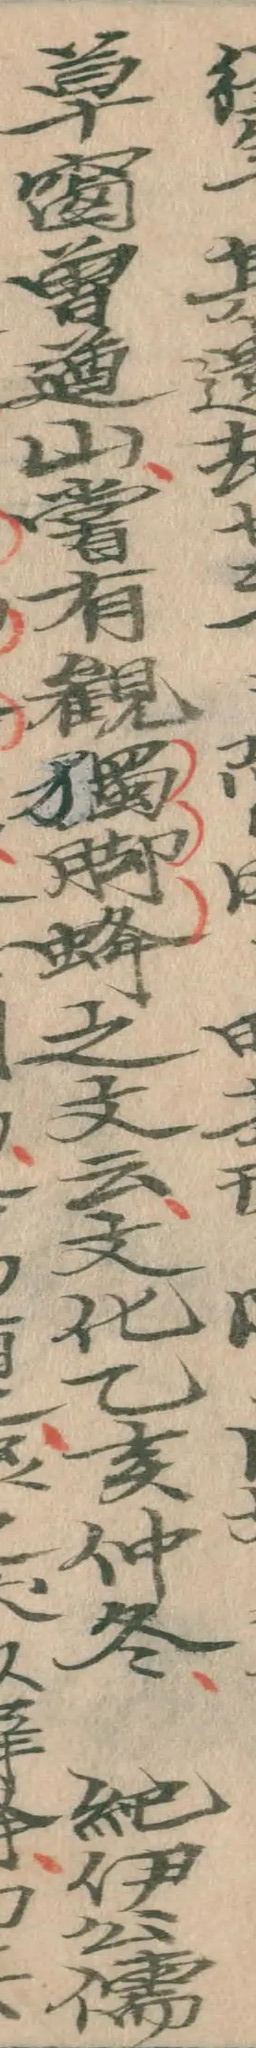草窗曽遒山、嘗有観獨脚蜂之文云、文化乙亥仲冬、紀伊公儒
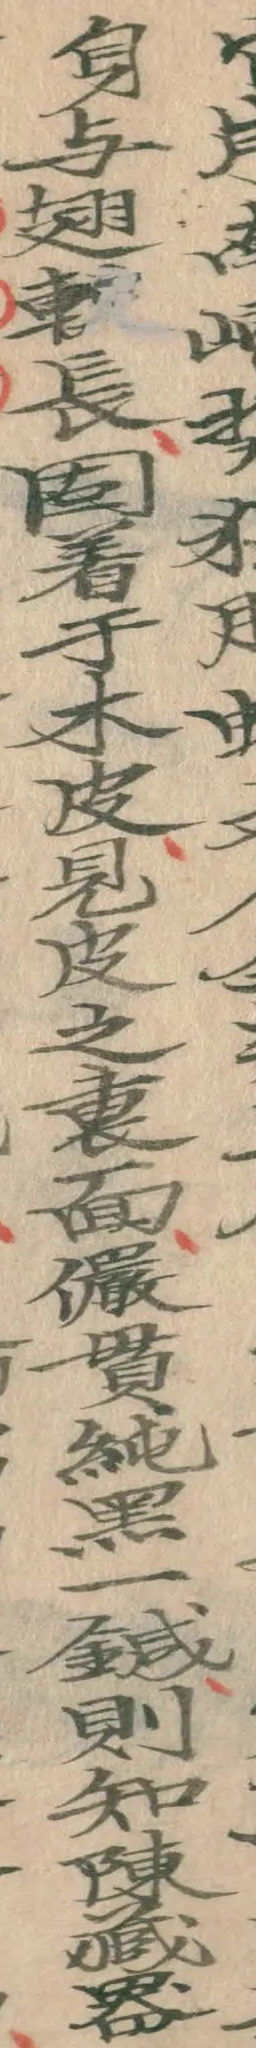身与翅較長、固着于木皮、見皮之裏面、儼貫純黑一鍼、則知陳藏器
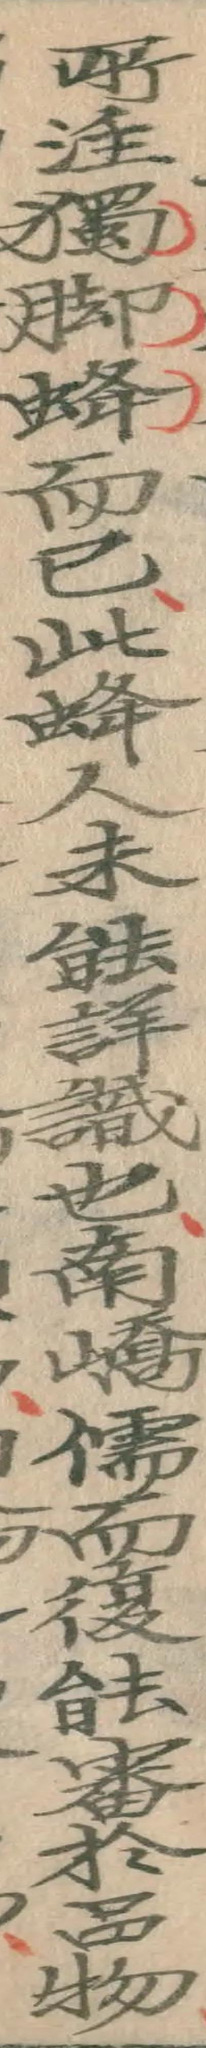所注獨脚蜂而已、此蜂人未能詳識也、南嶠儒而復能審於品物、
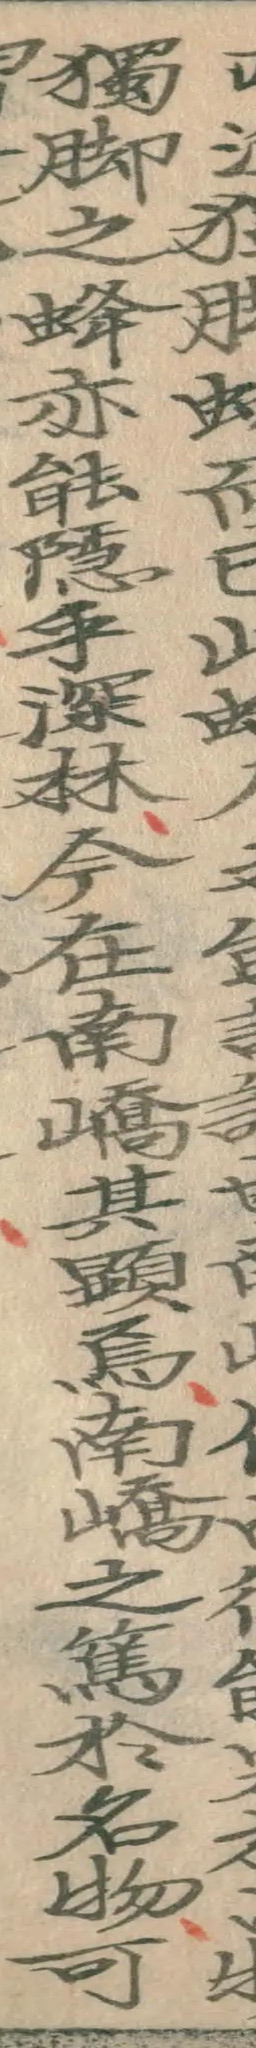獨脚之蜂亦能隠乎深林、今在南嶠其顕焉、南嶠之篤於名物、可
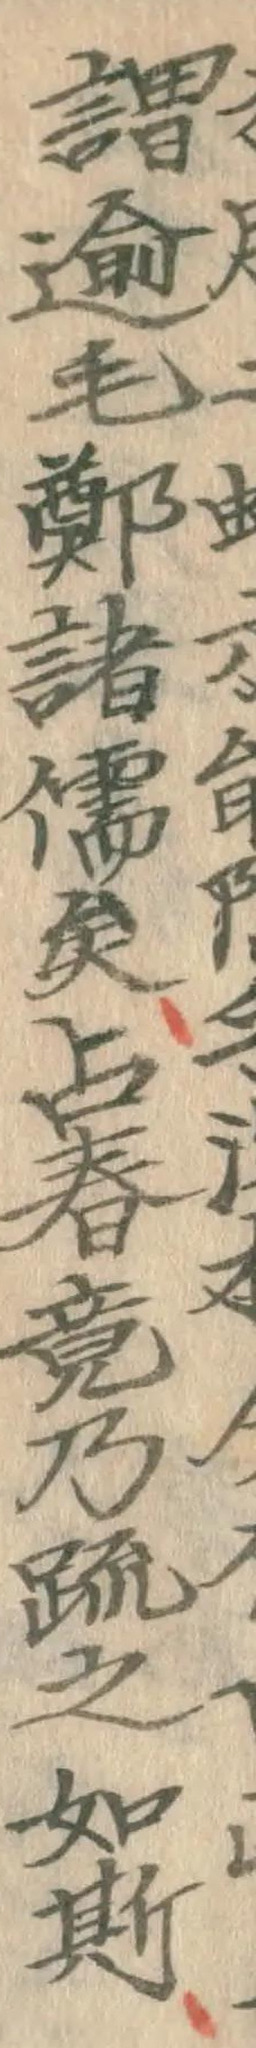謂逾毛鄭諸儒矣、占春竟乃䟽之如斯、
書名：千蟲譜 3巻. [2]
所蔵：国立国会図書館 National Diet Library, JAPAN
